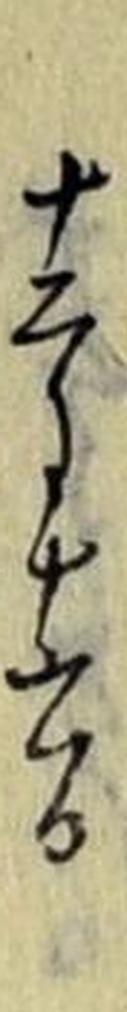十二月十六日
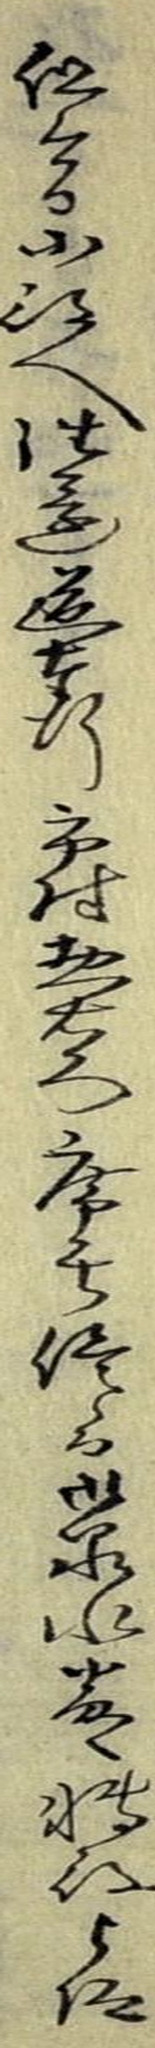但今日小役人往還道奉行市村惣右衛門席其儘ニ而御泉水番へ転役被仰
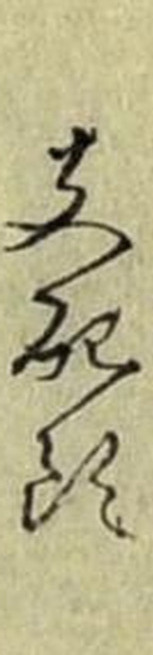支配頭
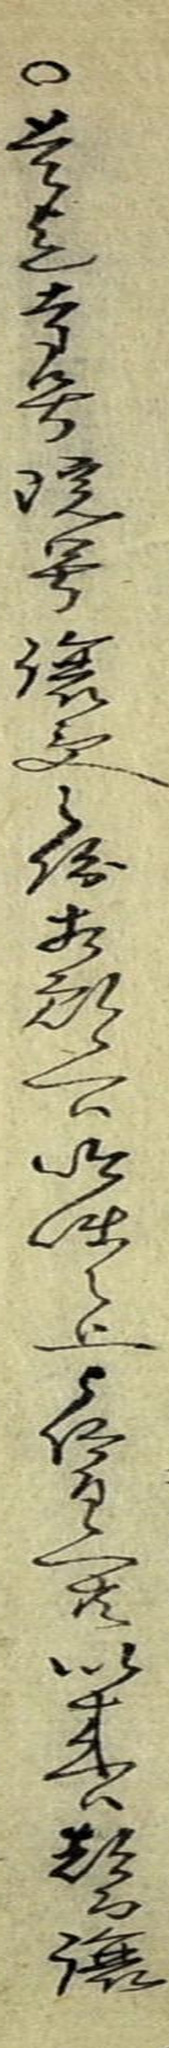〇是迄寺号院号譲受之儀相願候へハ吟味之上被仰付候へ共以来ハ都而譲
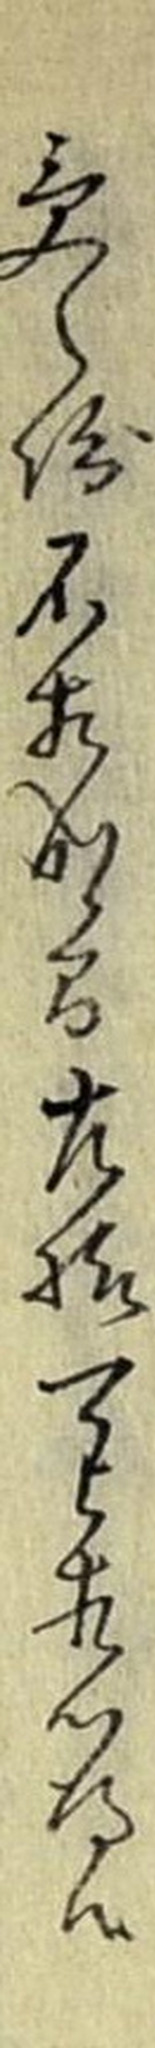受之儀不相成候間左様可被相心得候
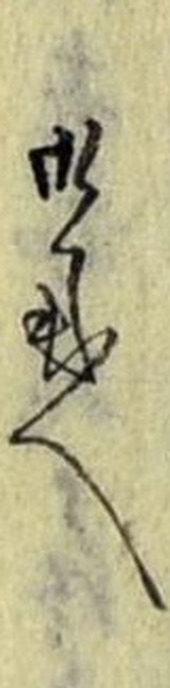御用人
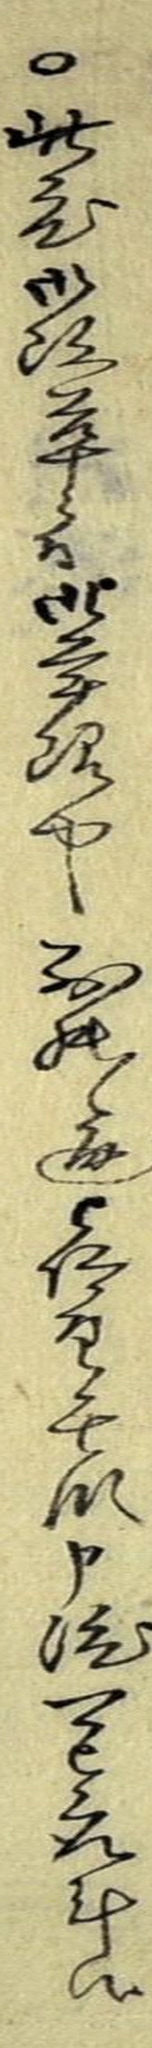〇此度御改革ニ付御年限中別紙之通被仰付候其段申渡可被取計候

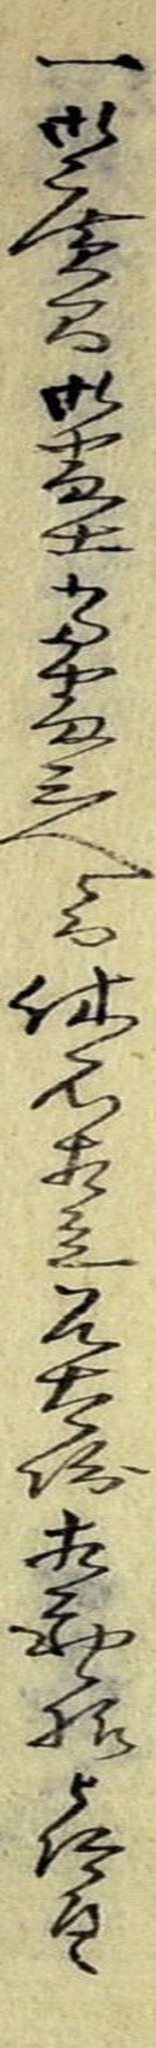一御広間御番士当番三人ニ而休不相立乍太儀相勤候様被仰付候
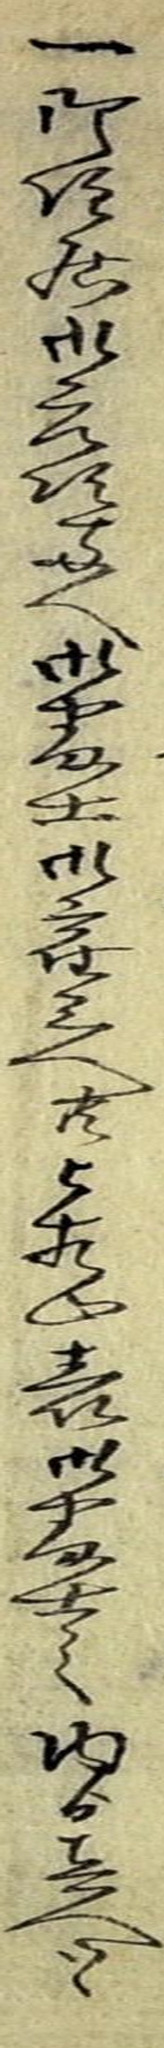一御住居御取次両人御番士御雇三人共被相止表御番士之内ゟ壱人ツヽ
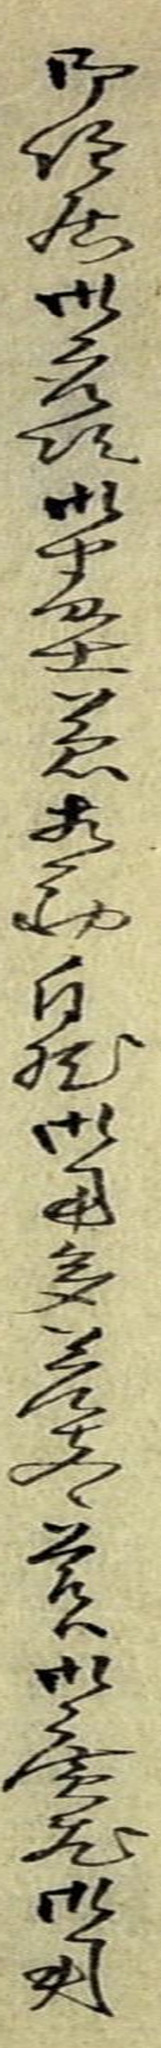御住居御取次御番士兼相勤自然御用多差支候節ハ御広敷御用
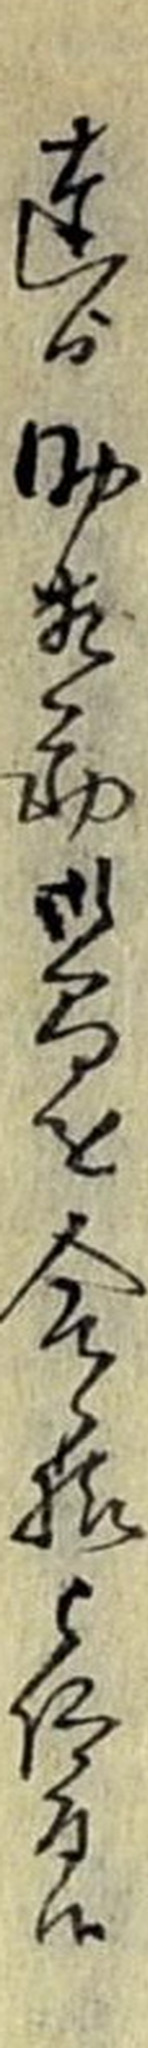達ゟ助相勤御間を合候様被仰付候
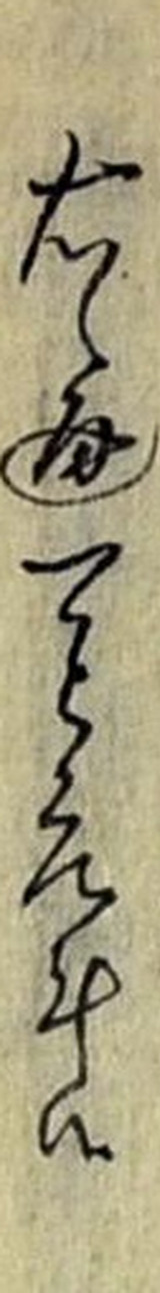右之通可被取計候
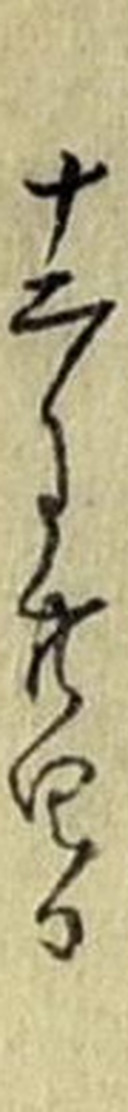十二月廿四日
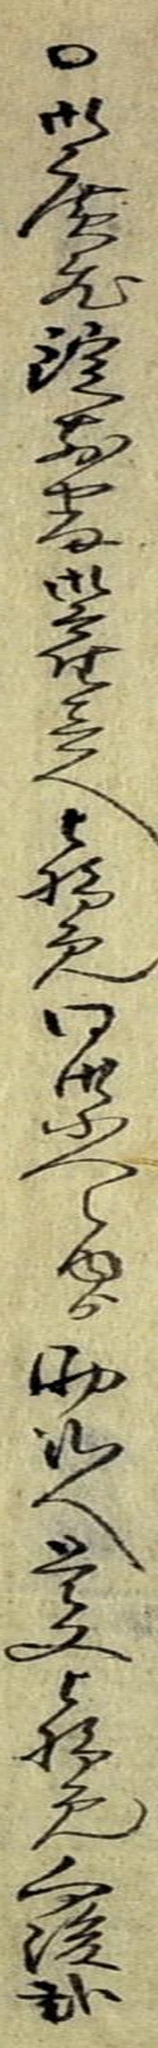〇御広敷錠前番御雇壱人被指免同御小人之内ゟ助弐人是又被指免向後弐
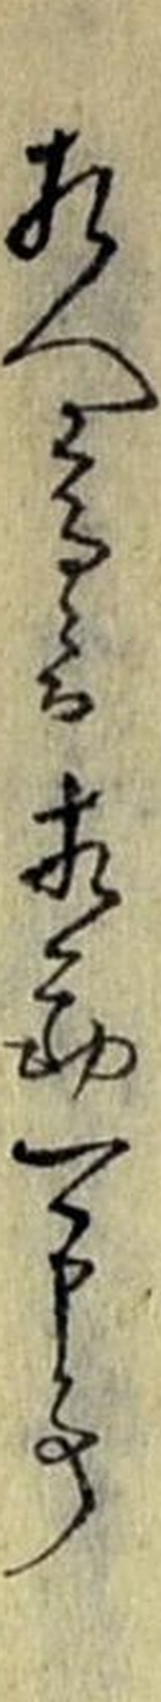拾人高ニ而相勤可申事
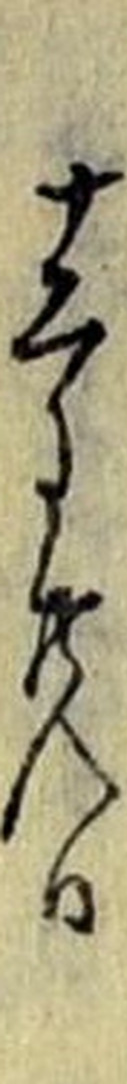十二月廿八日
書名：命令之部 五
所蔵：福井県文書館 Fukui Prefectural Archives
